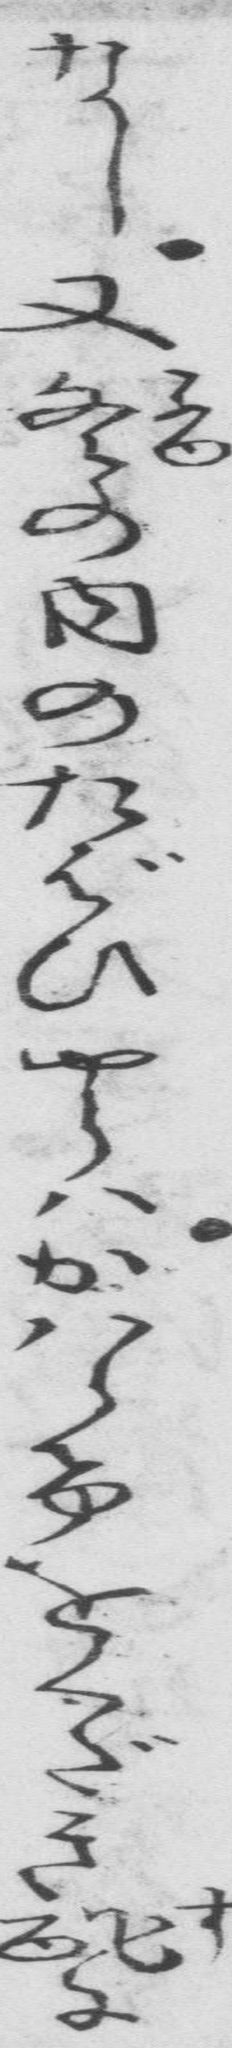なし。又冬の内のたばひやうは。かはらけくだき酢に
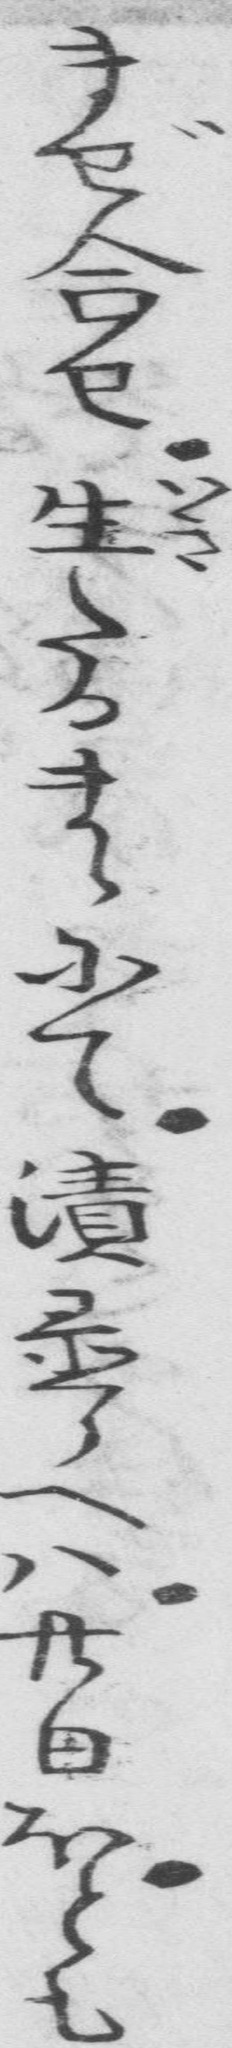まぜ合せ。生たるまゝにて。漬置候へは。廿日ほども
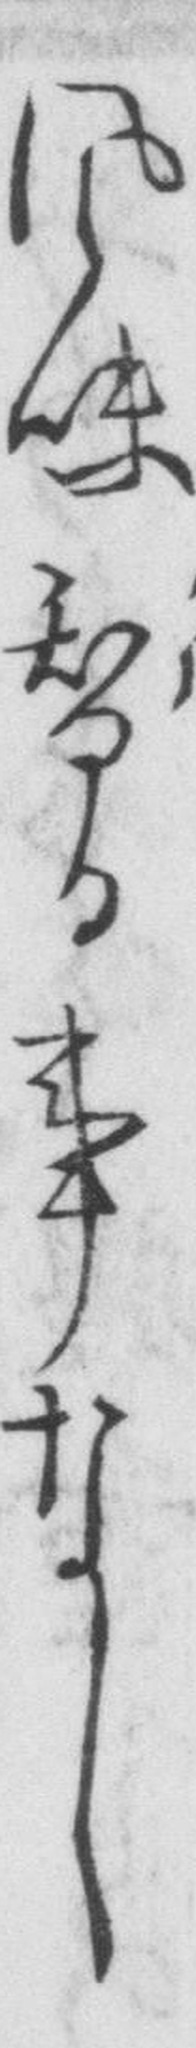風味替る事なし
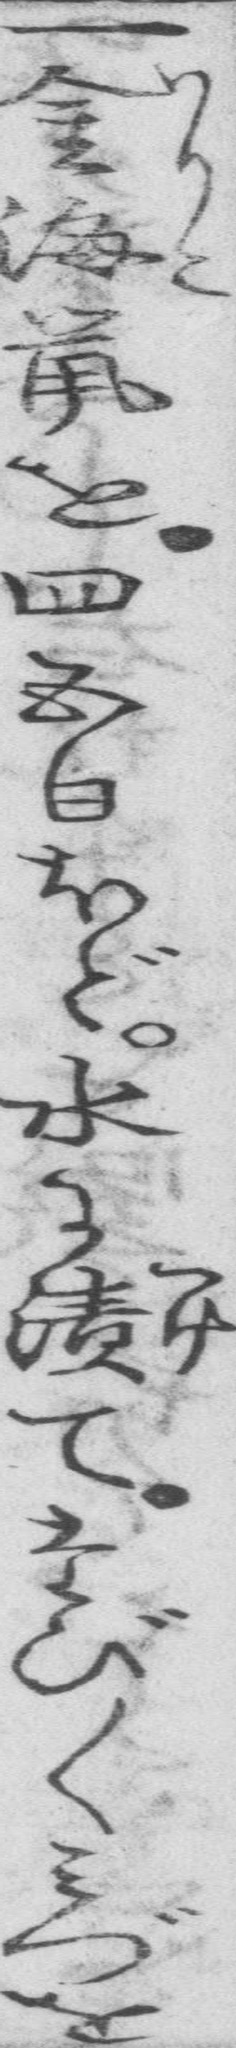一金海鼠を。四五日ほど。水に漬て。たび〳〵みづを
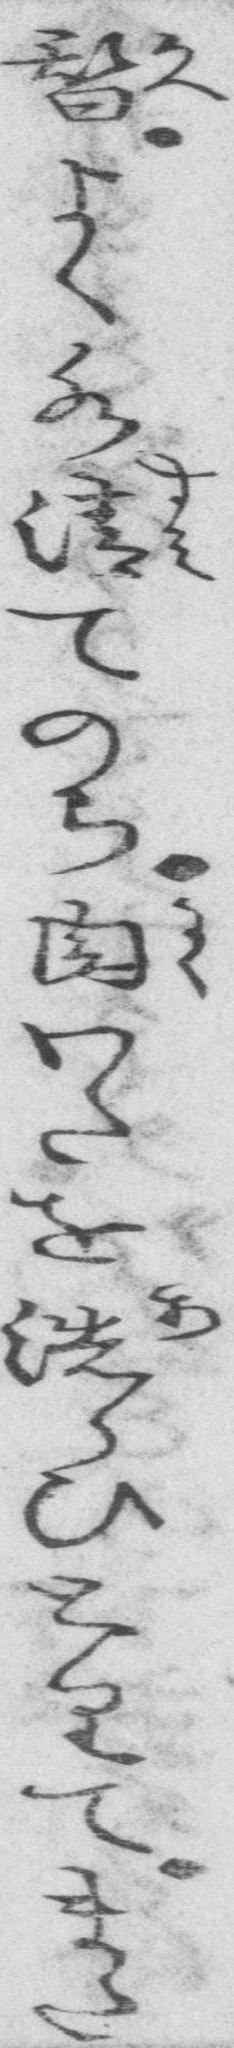替。よく水清てのち。肉わたを洗らひとりて。また
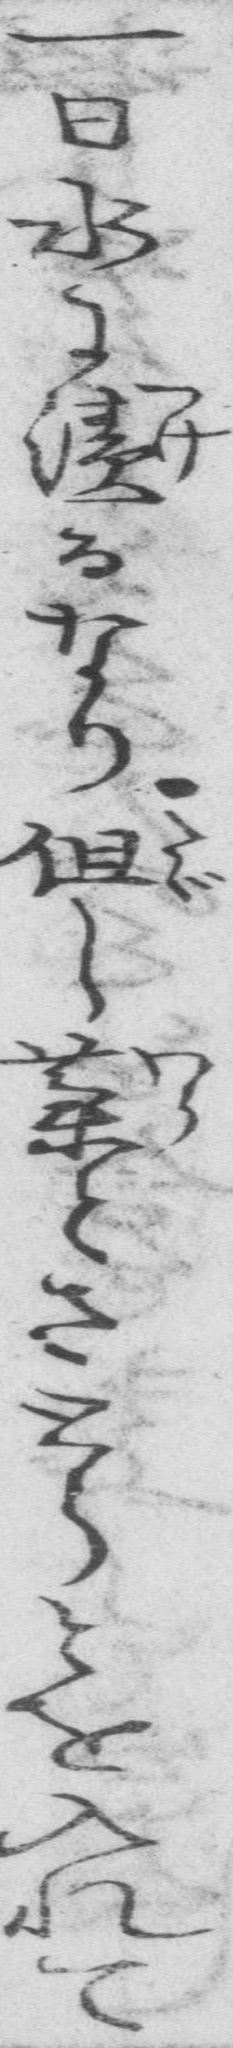一日水に漬るなり。但し藁とさとうとを入れて
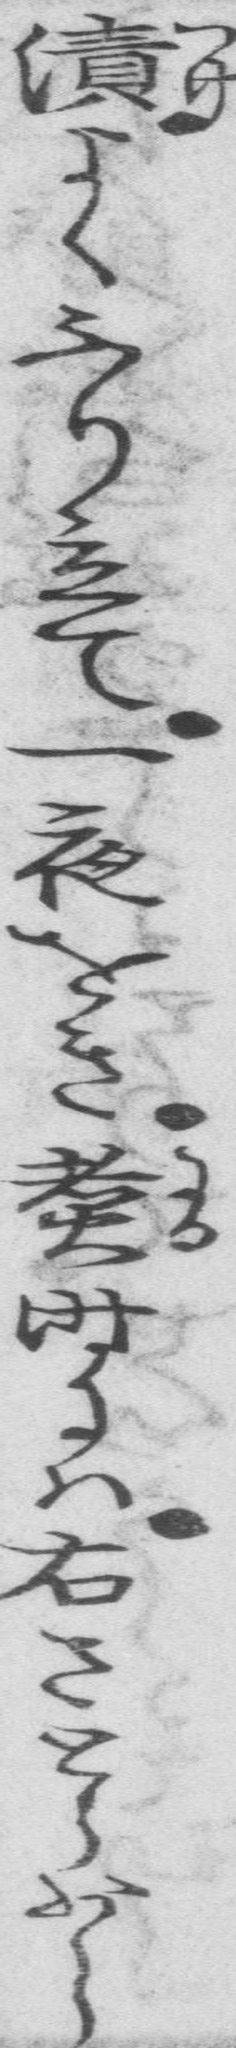漬。よくふり立て。一夜をき。煮時には。右さとう少し
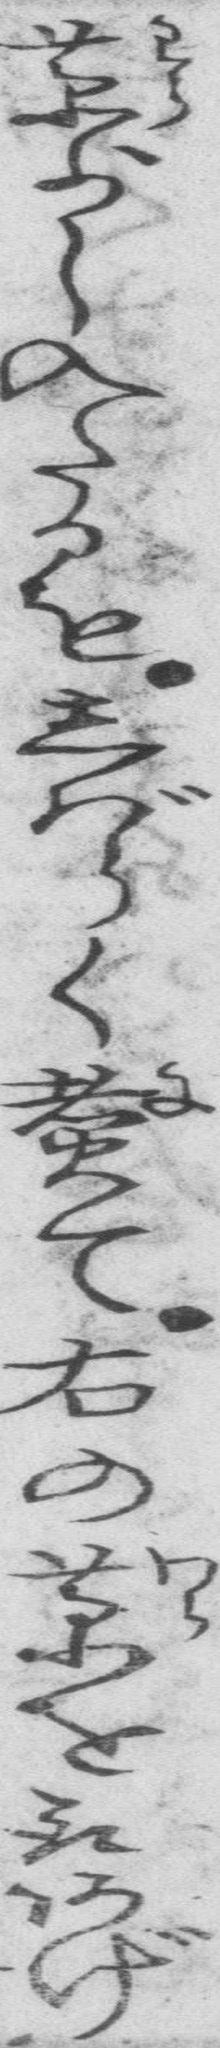藁少し入たるを。しばらく煮て。右の藁を取あげ
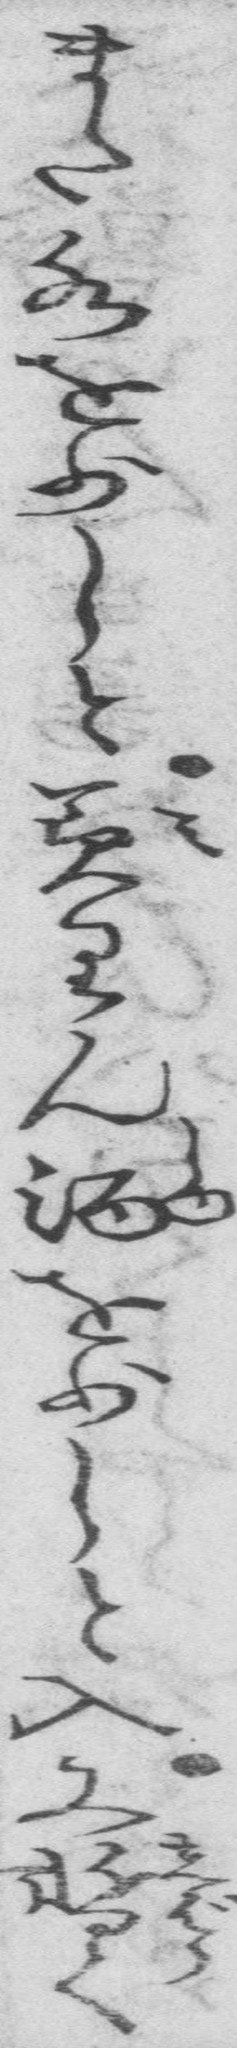また水を少しと。美りん酒を少しと入。又暫く
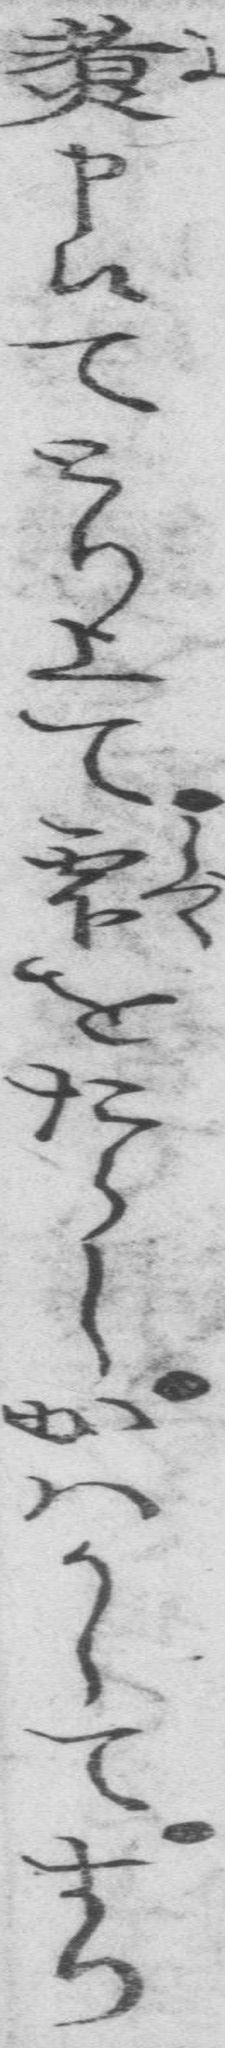煮申候てとり上て。雫をたらし、かはかして。すり
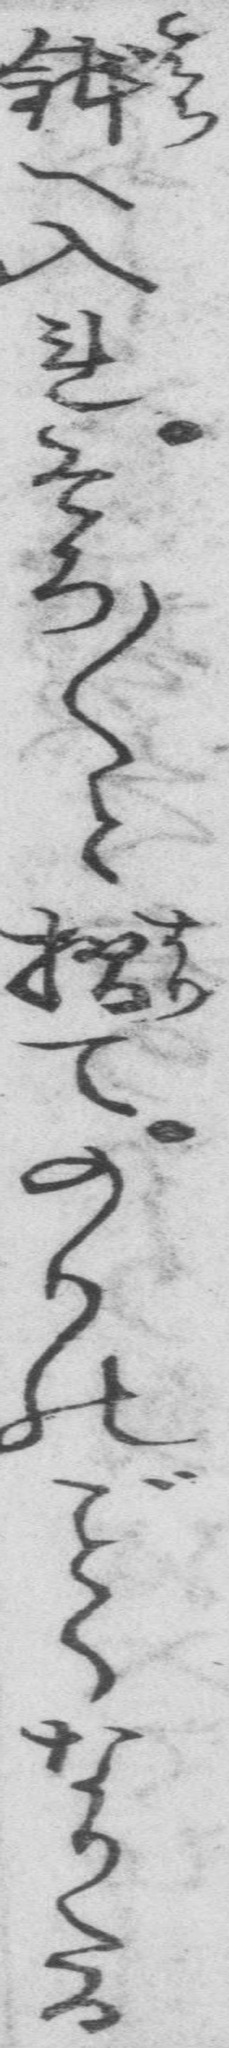鉢へ入れ。そろ〳〵と摺て。のりのごとくなりたる
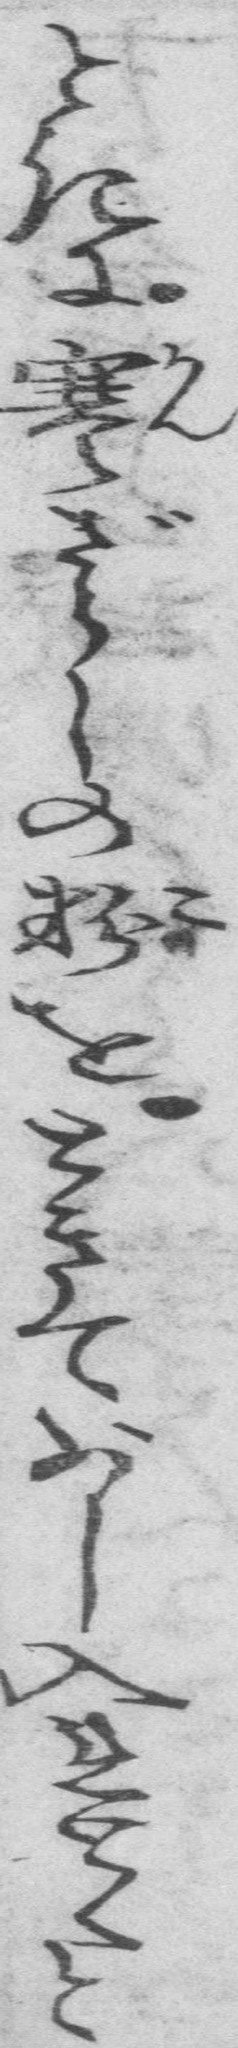ときに。寒ざらしの粉を。ときて少し入れとくと

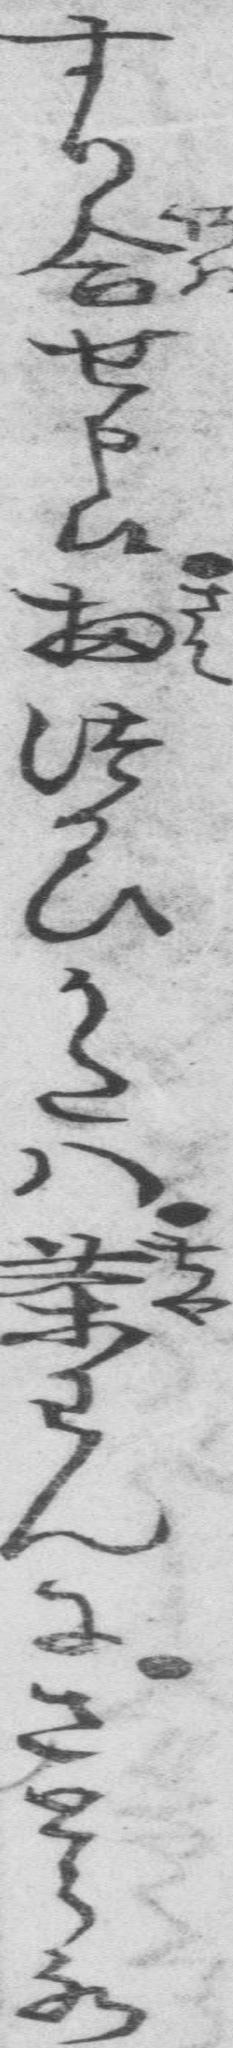すり合せ申候。扨つかひかたは。茶わんに。さとう水
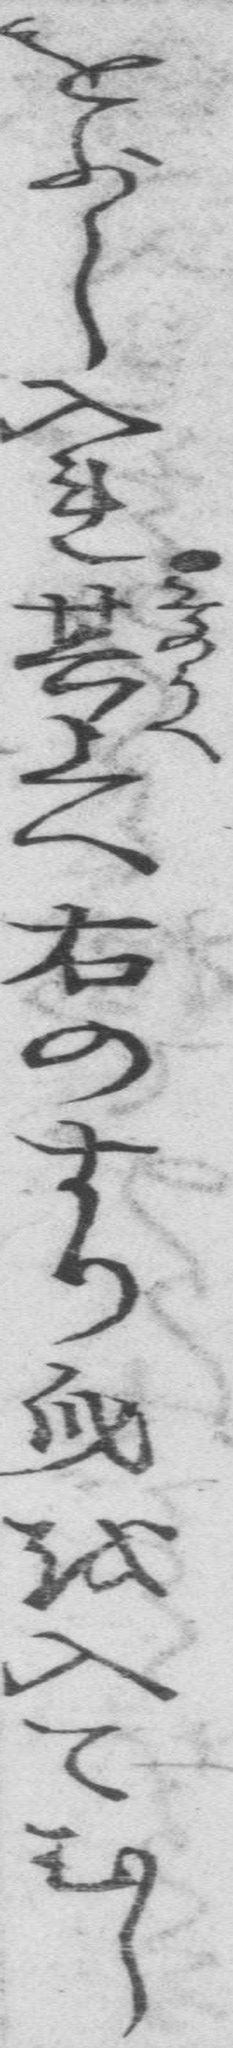を少し入れ。其上へ右のすり身を入てむし
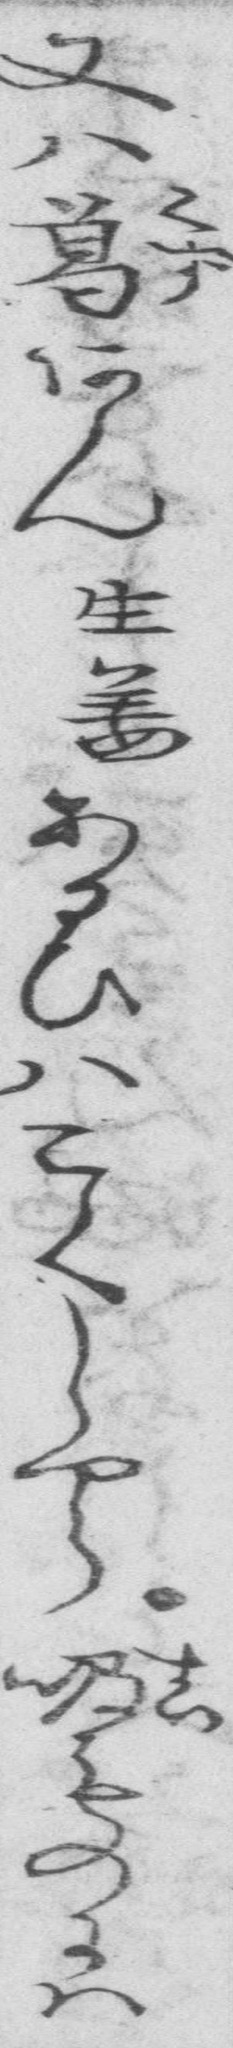又は葛あん生姜あわひはこくしやう。吸ものには
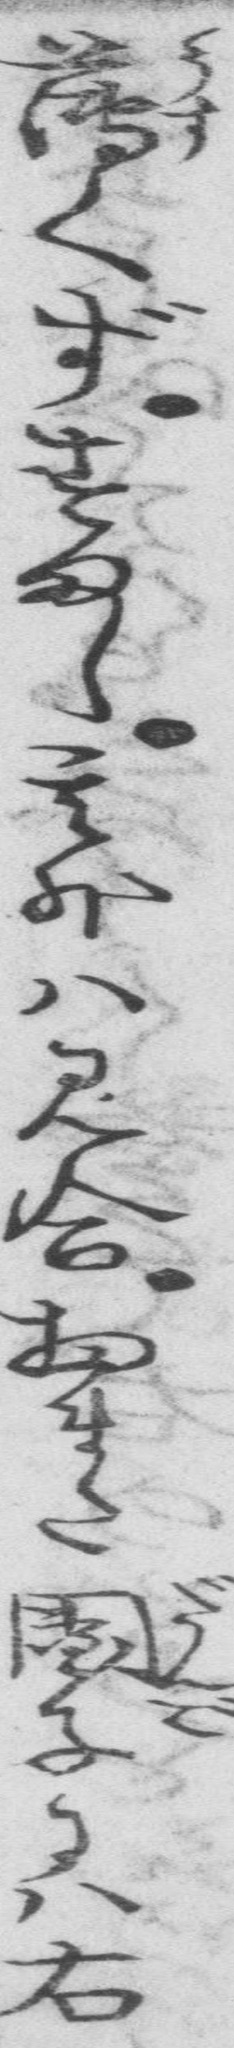薄くず。すまし。其外は見合。扨また団子には右
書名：萬寳料理秘密箱
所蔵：大阪府立大学学術情報センター 国文学研究資料館
